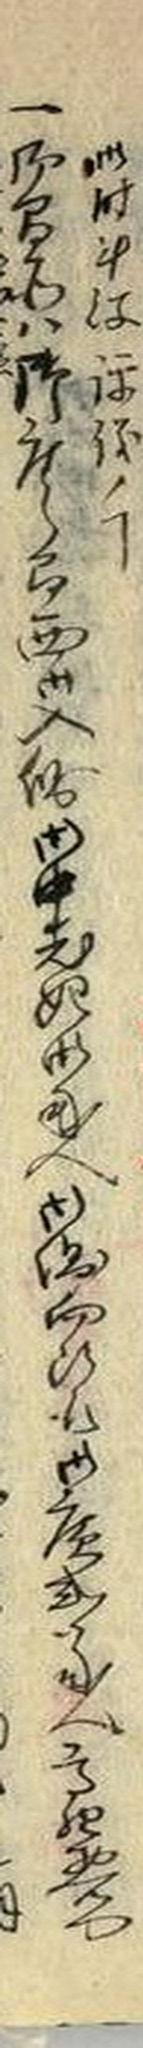一御間所ハ御座之間西御入側御中老始御用人御側向頭取御広式御用人高野惣左衛門
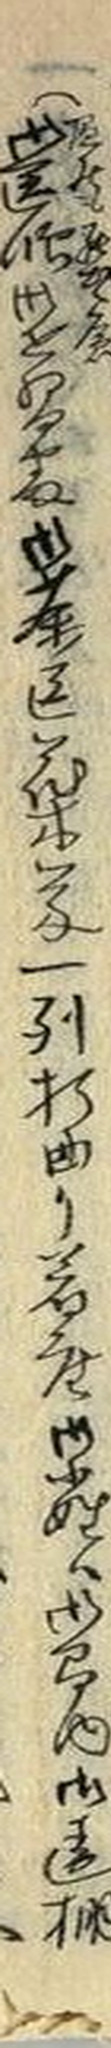隠居も罷出候廉御医師御近習番御茶道花木栄一列打曲り着座御小姓ハ御間内御違棚
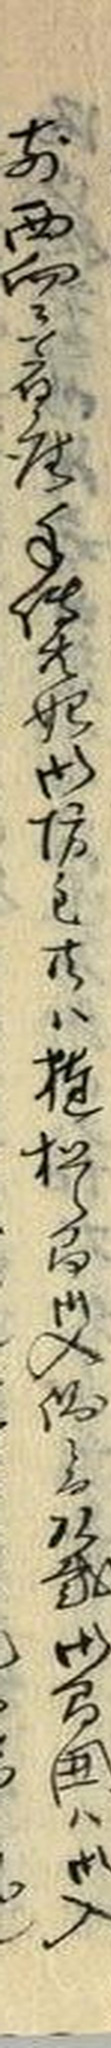前西向ニ着座手伝共始御坊主共ハ韃靼之間御入側ニ而頂戴御間囲ハ御入
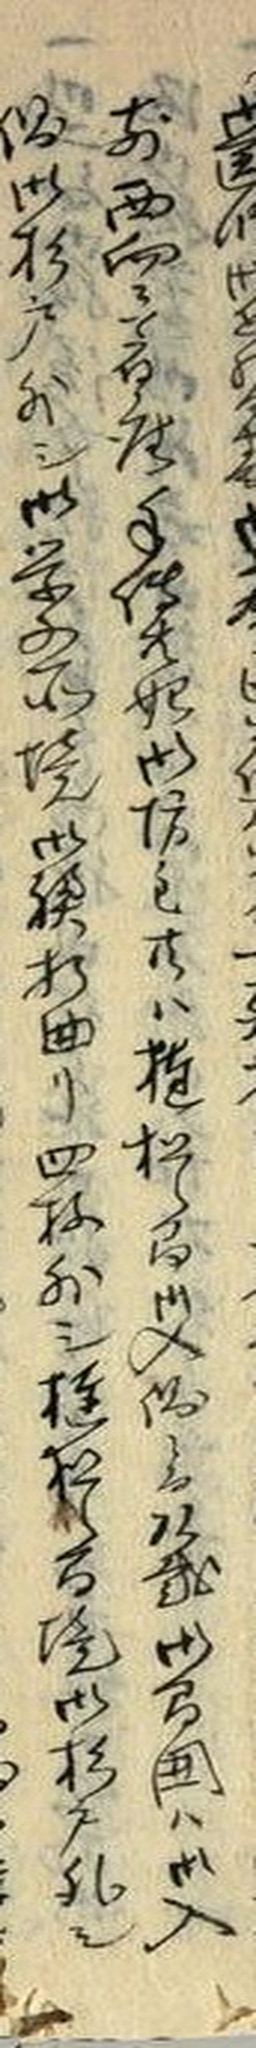側御杉戸外シ御学文所境御襖打曲り四枚外シ韃靼之間境御杉戸外シ
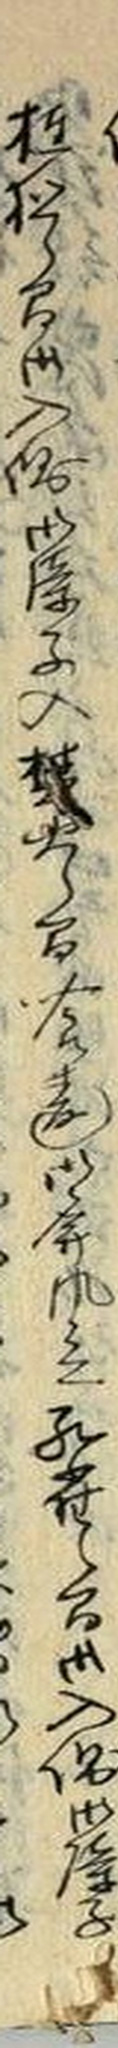韃靼之間御入側御障子入焚火之間喰違御屛風立孔雀之間御入側御障子
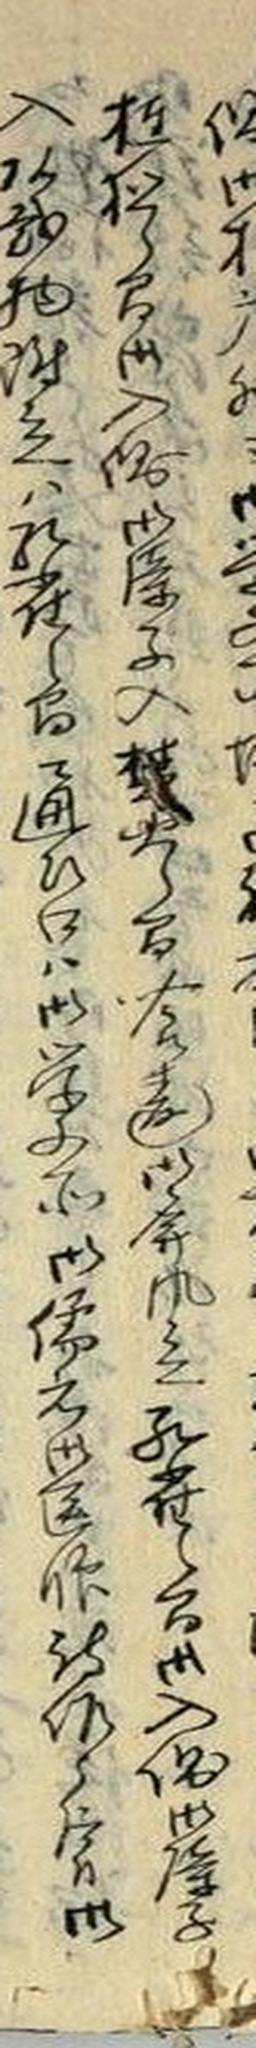入頂戴物附立ハ孔雀之間通ひ口ハ御学文所御儒者御医師詩作被仰付御
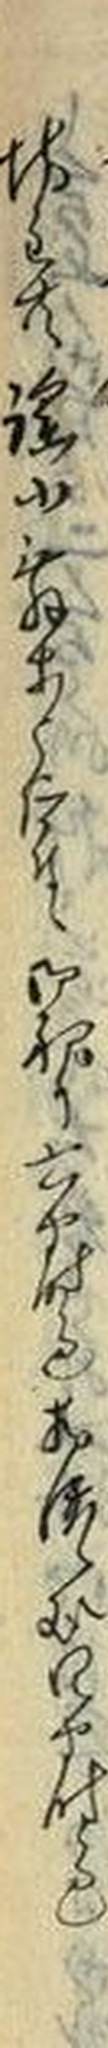坊主共謡小舞等被仰付候御初り六半時過相済候処四半時過
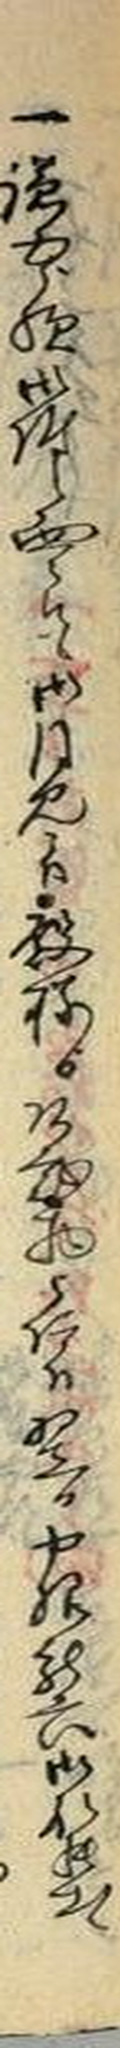一謙五郎様御附之面々江も御月見ニ付殿様ゟ頂戴物被仰付翌日中根新六御礼罷出候
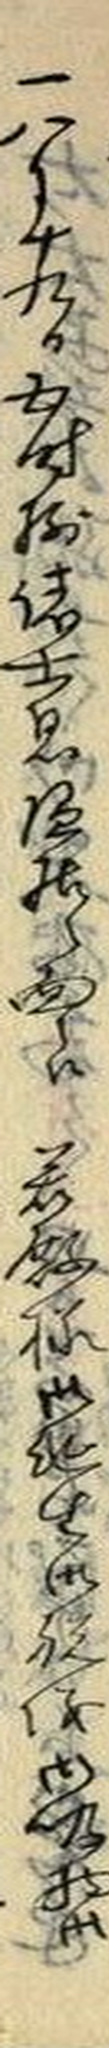一八月十九日五時揃諸士息隠居之面々江若殿様御誕生御祝儀御吸物御
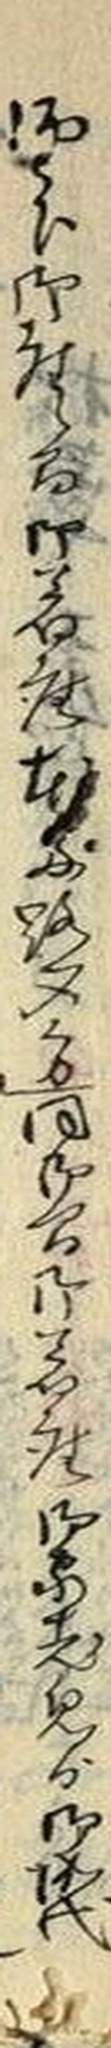酒被下御座之間御着座本多路夕方」同御間御着座御家老息ゟ御城代
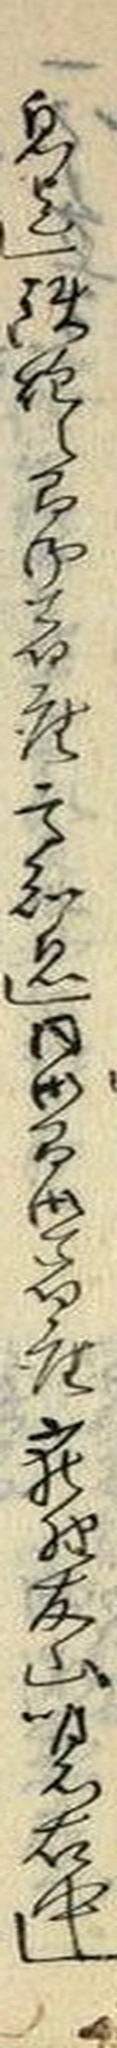息迄」鉄炮之間御着座高知息」同御間御着座荻野友山明石右中」
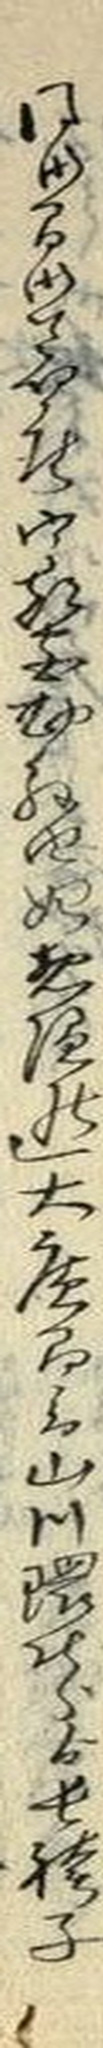同御間御着座宇都宮勘解由始惣隠居」大広間ニ而山川環次郎ゟ長袴子
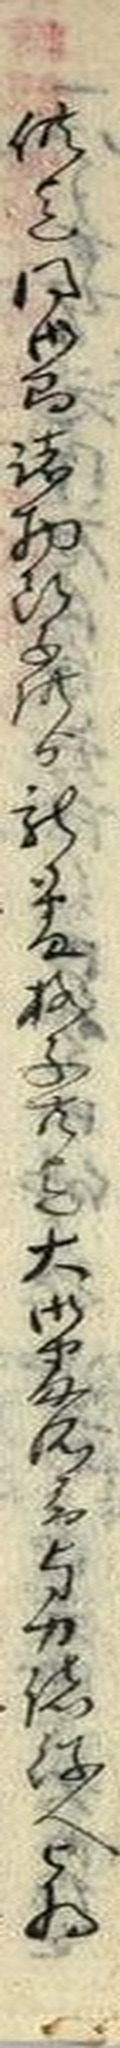供迄同御間諸物頭子供ゟ新御番格子共迄大御番所ニ而与力諸役人被為
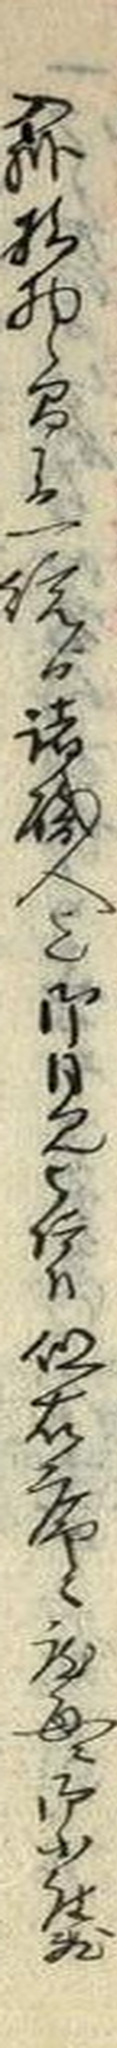入掛指物之間ニ而一統ゟ諸職人迄御目見被仰付但右席々度毎ニ御小座敷
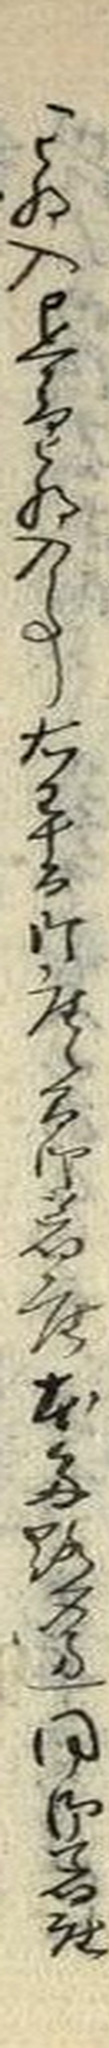へ被為入申上候而被為入候事右畢而御座之間御着座本多路夕方同御着座
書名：少傅日録抄（斉承付側向頭取日記、在国）
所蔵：福井県文書館 Fukui Prefectural Archives
